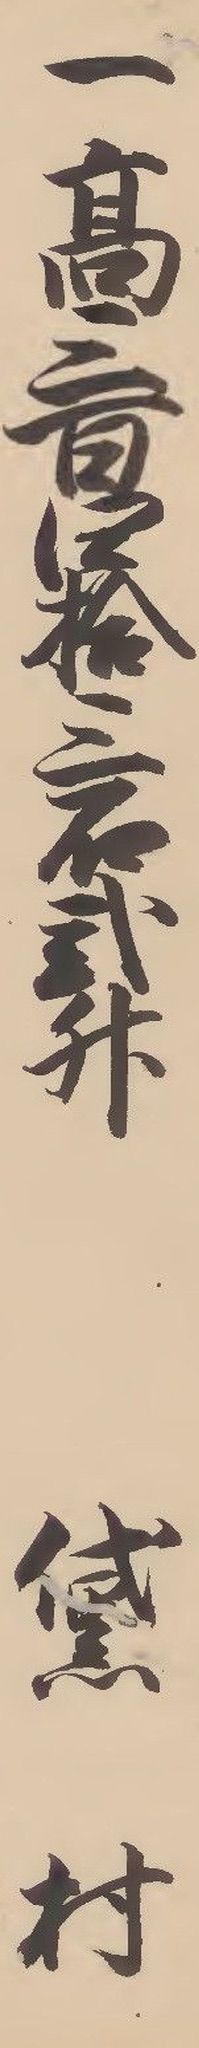一高三百四拾三石弐升黛村
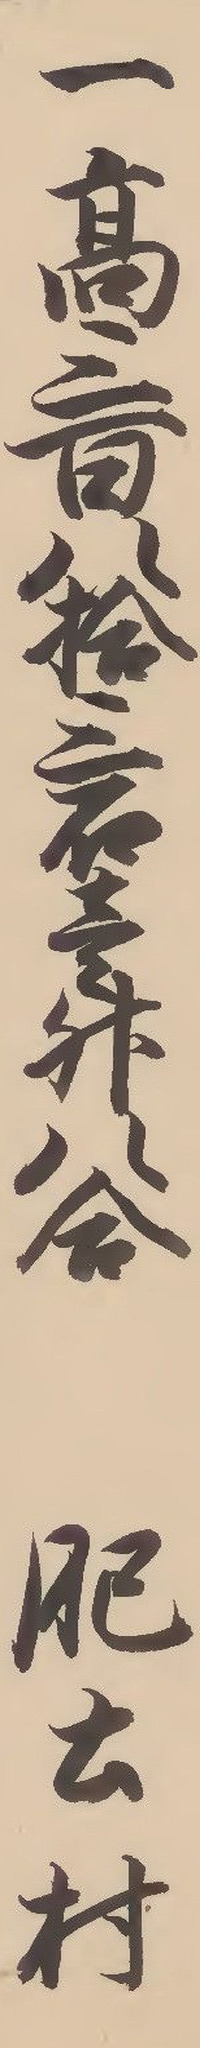一高三百八拾三石壱升八合肥土村
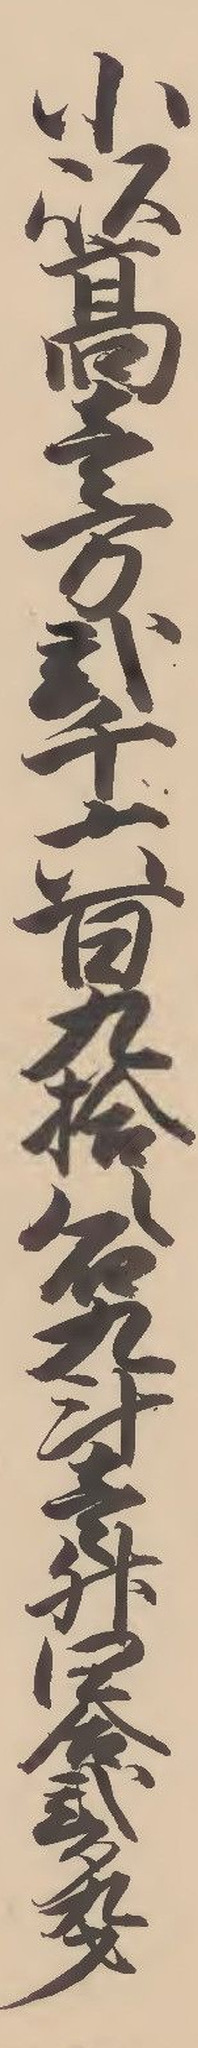小以高壱万弐千六百九拾八石九斗壱升四合弐勺九才
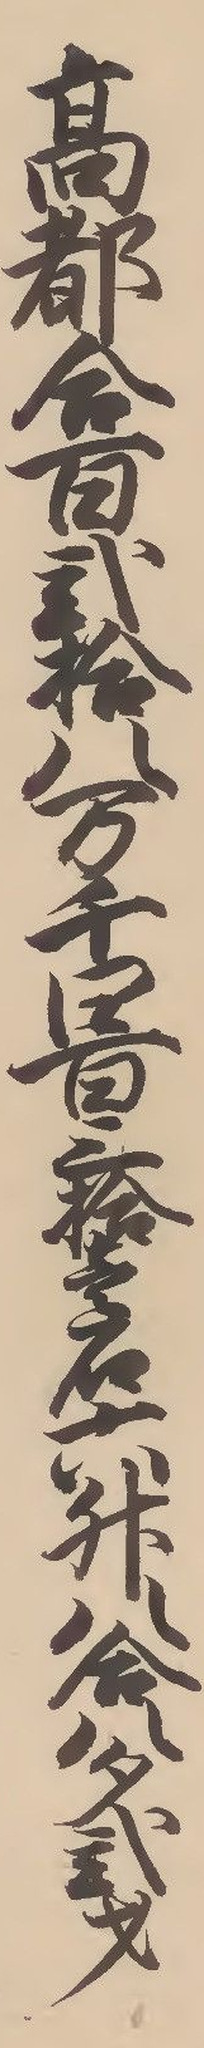高都合百弐拾八万千四百三拾壱石六升八合八勺弐才
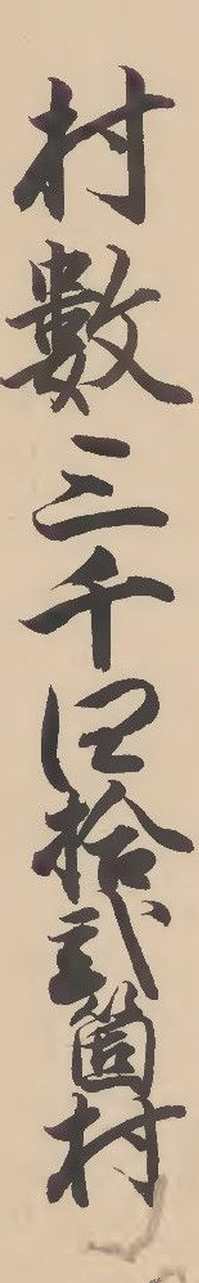村数三千四拾弐箇村

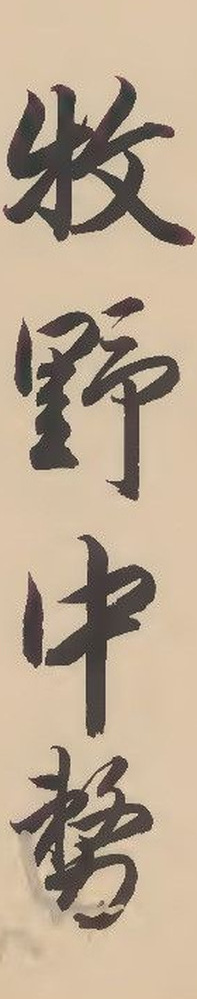枚野中務
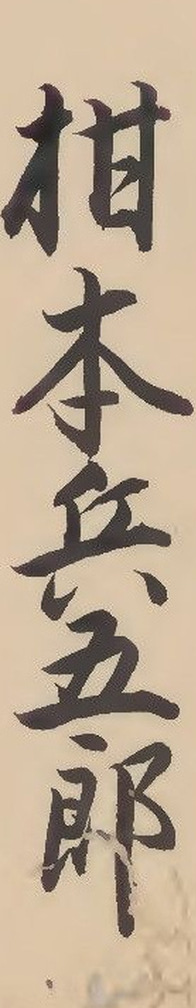柑本兵五郎
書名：武蔵国郷帳　下
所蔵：国立公文書館 National Archives of Japan
